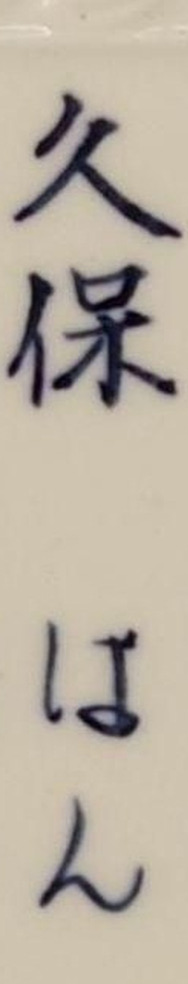久保はん
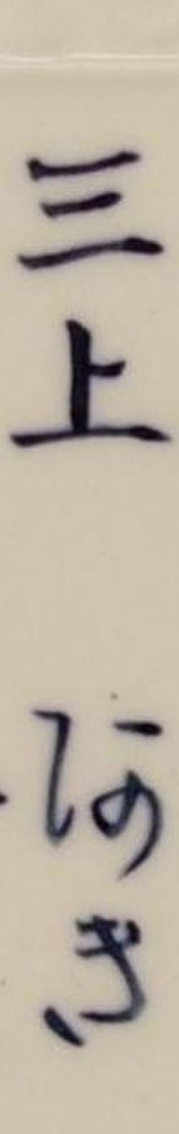三上あき
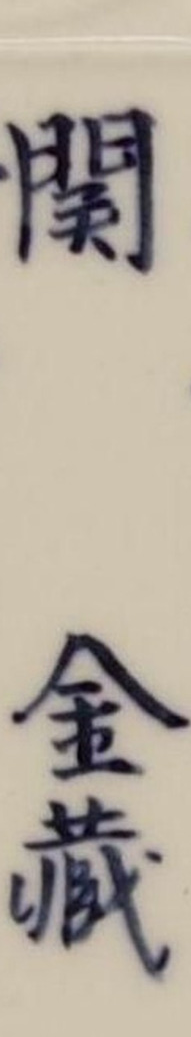関金蔵
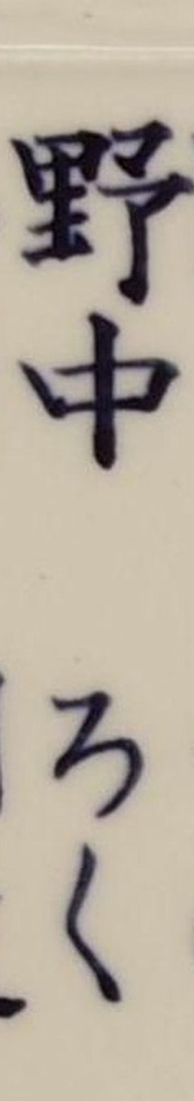野中ろく
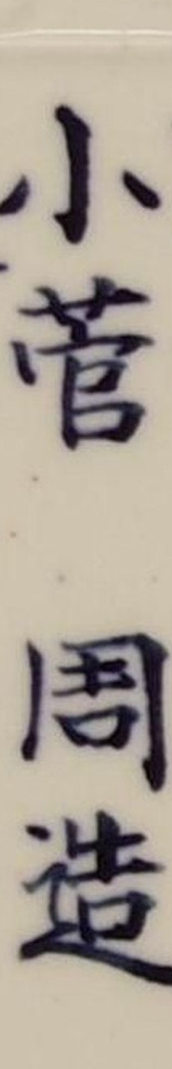小菅周造
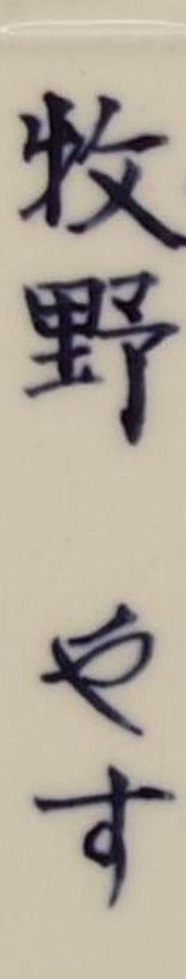牧野やす
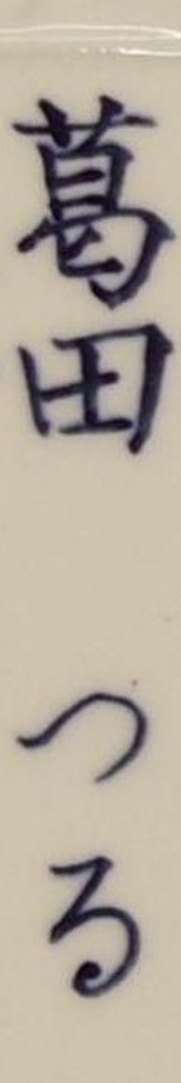葛田つる
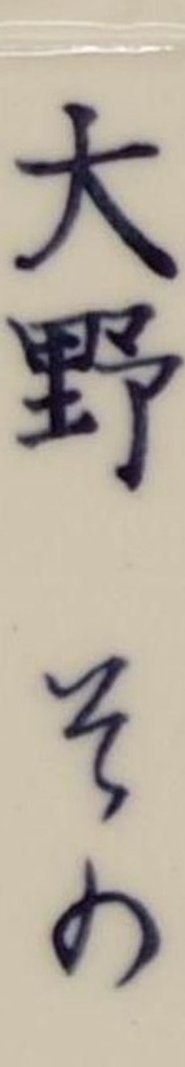大野その
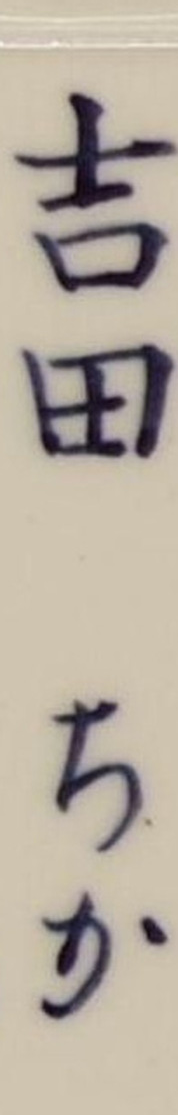吉田ちか

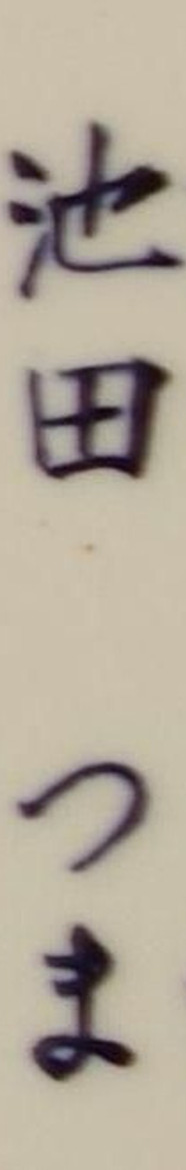池田つま
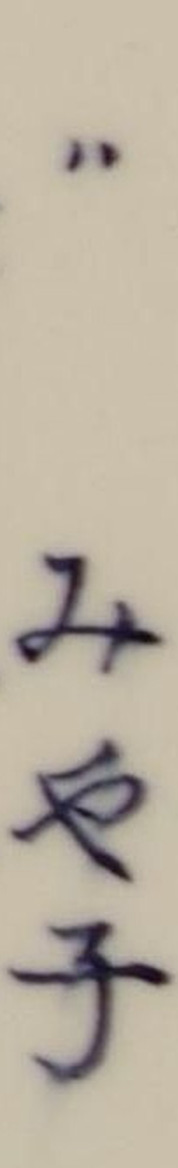みや子
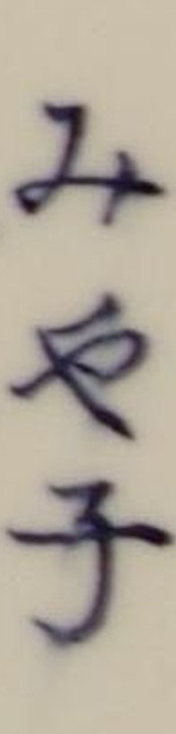みや子
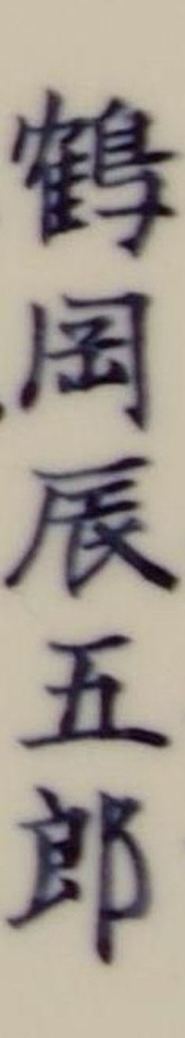鶴岡辰五郎
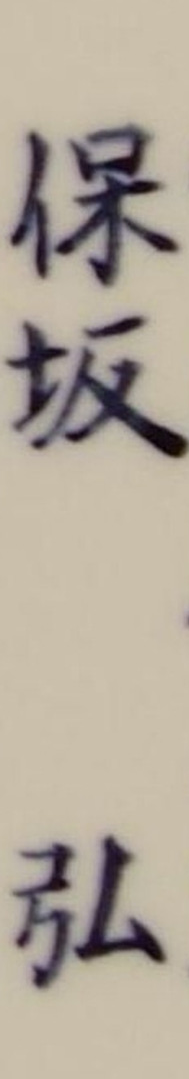保坂弘
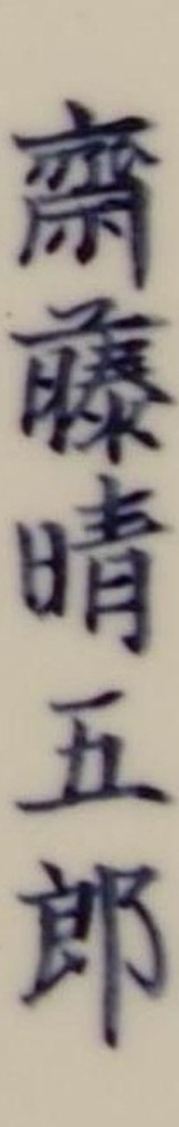斎藤晴五郎
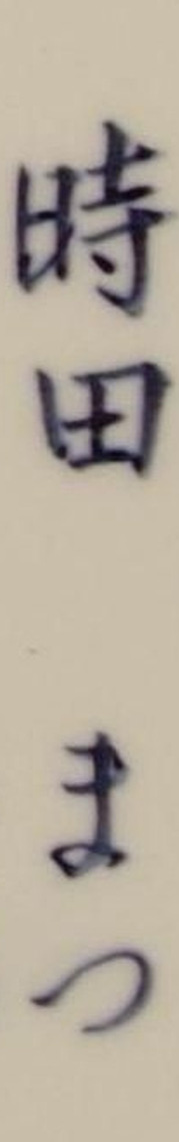時田まつ
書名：E~L
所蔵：高野山金剛峯寺
